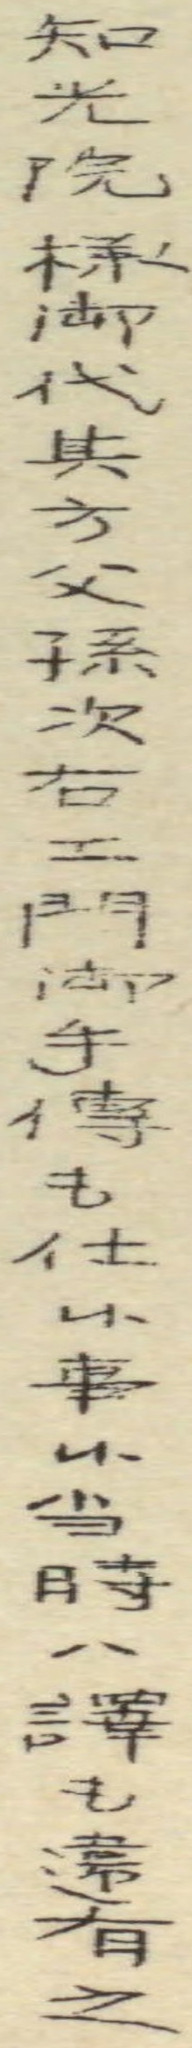知光院様御代其方父孫次右エ門御手伝も仕候事候当時ハ訳も違有之
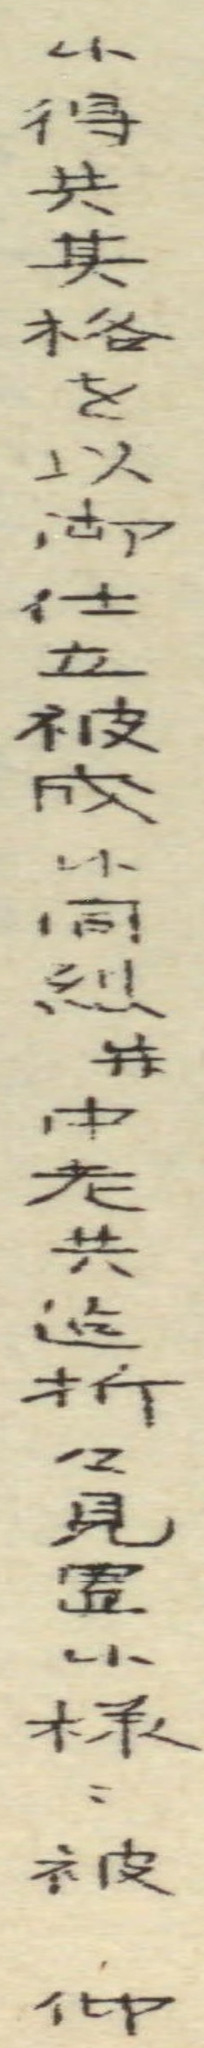候得共其格を以御仕立被成候間れ烈并中老共迄折々見置候様二被仰
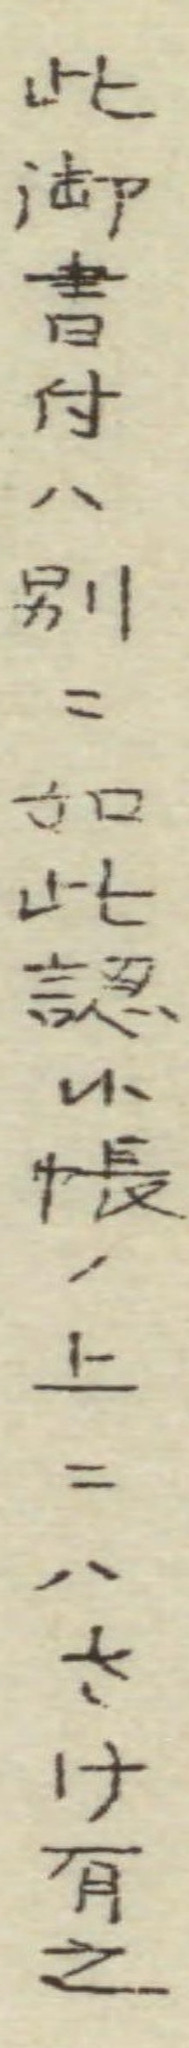此御書付ハ別二如此認候帳ノ上二ハさけ有之
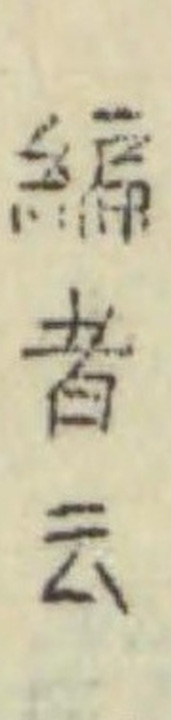編者云
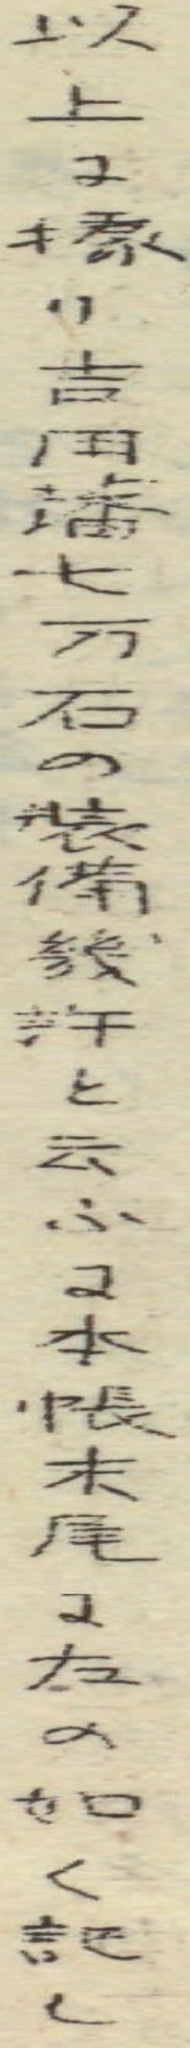已上に掾り吉田藩七万国の装備幾許と云ふに本帳末尾に左の如く記し
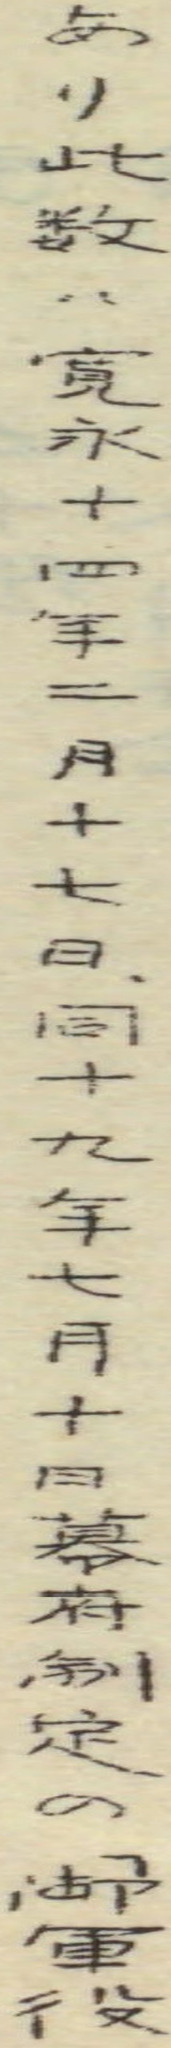あり此数ハ寛永十四年二月十七日同十九年七月十四日幕府制定の「御軍役
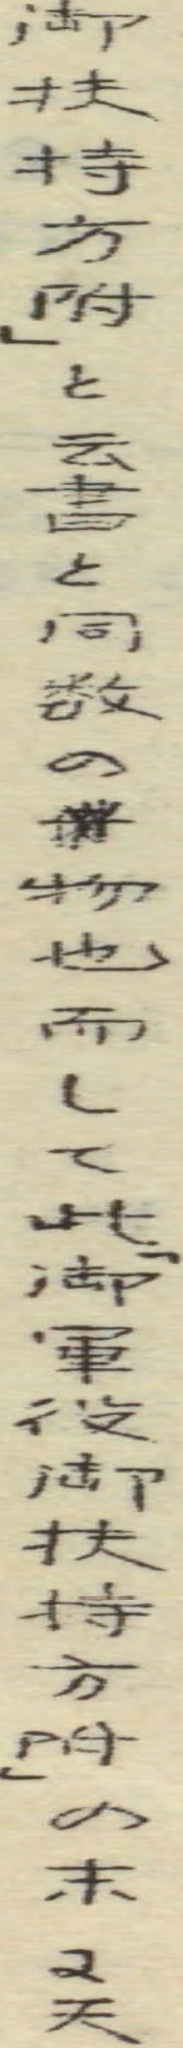御扶持方附」と云書と同数の書物也而して此「御軍役御扶持方附」の未に天
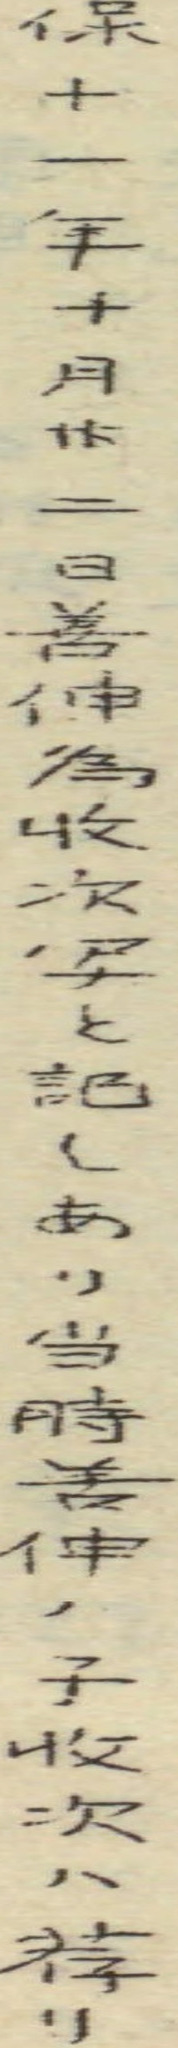保十一年十月廿二日善伸為収次写と記しあり当時善伸ノ子収次ハ荐り
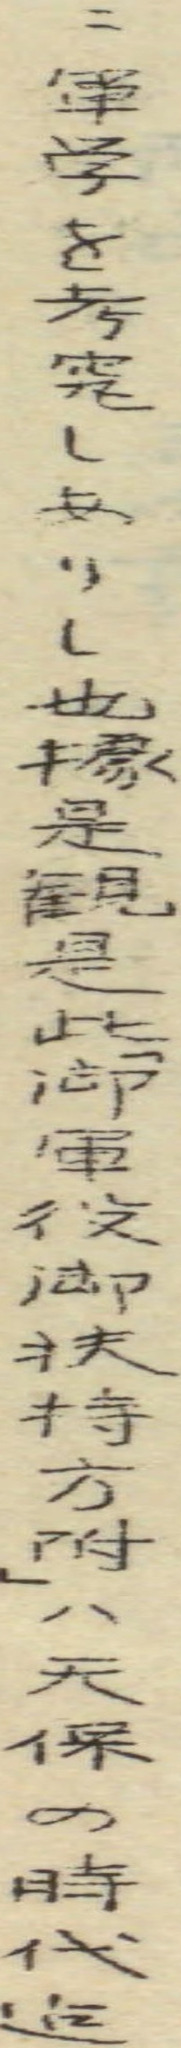二軍学を考究しありし也掾是観是此「御軍役御扶持方附」ハ天保の時代迄
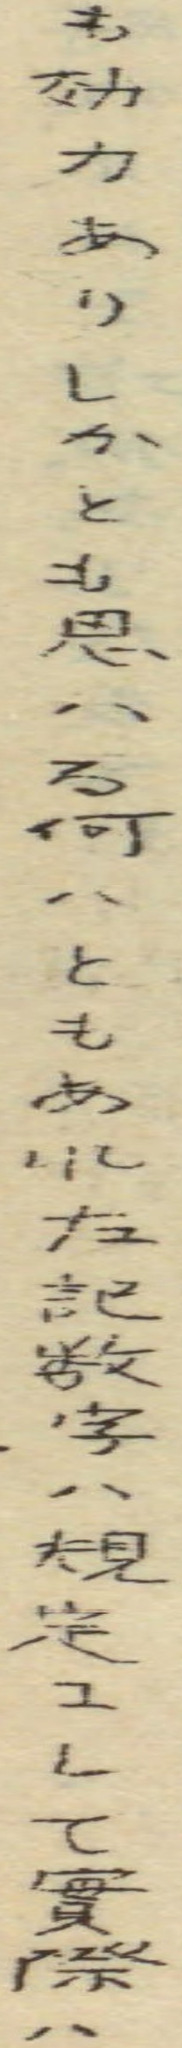も効力ありしかとも思ハる何ハともあれ左記数字は規定にして実際ハ

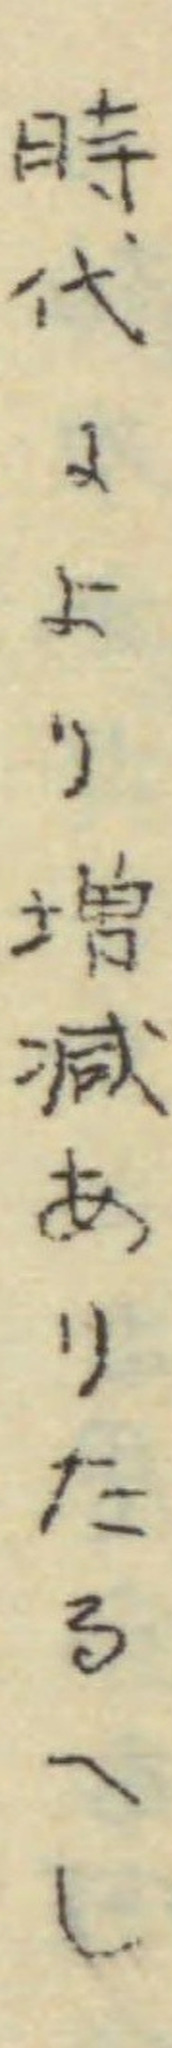時代により増減ありたるへし
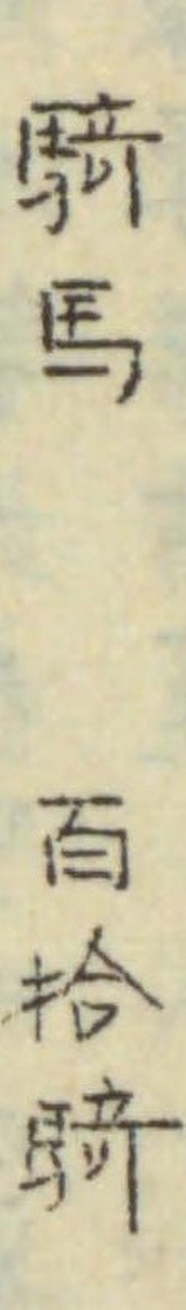騎馬百拾騎
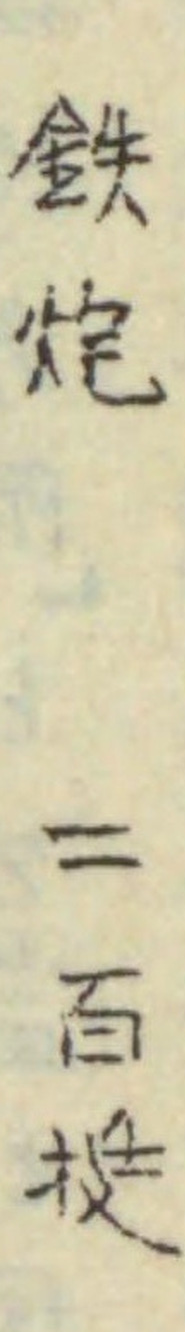鉄砲二百挺
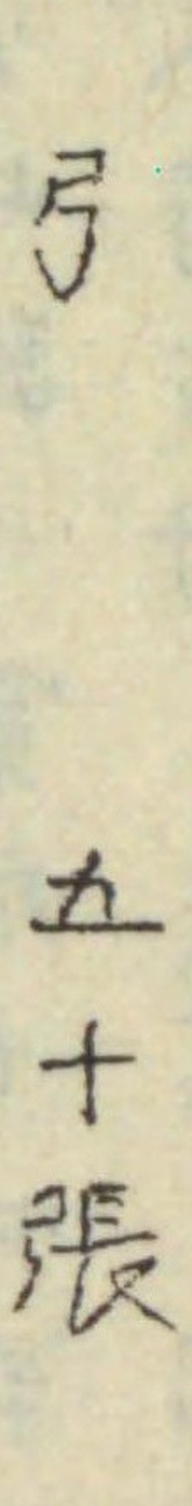弓五十張
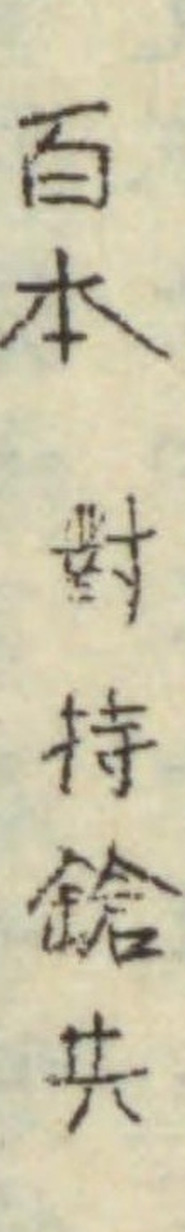槍百本対持槍共
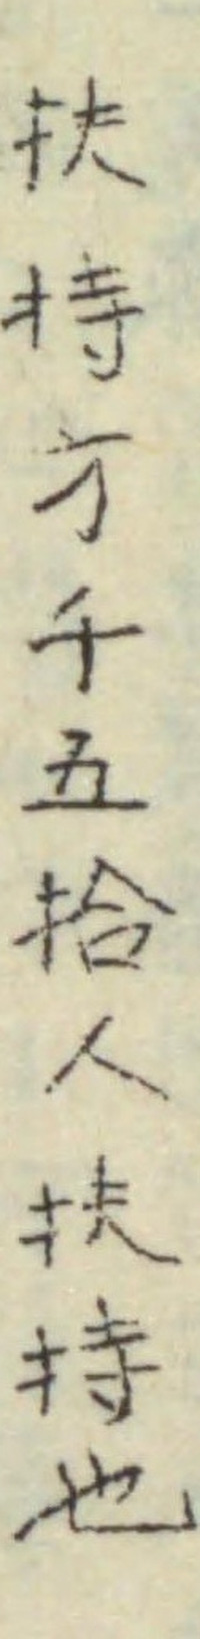扶持方壱千五十人扶持也
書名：三河吉田藩動員史料
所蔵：国立国会図書館 National Diet Library, JAPAN
